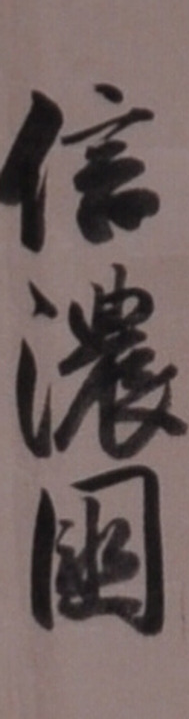信濃国
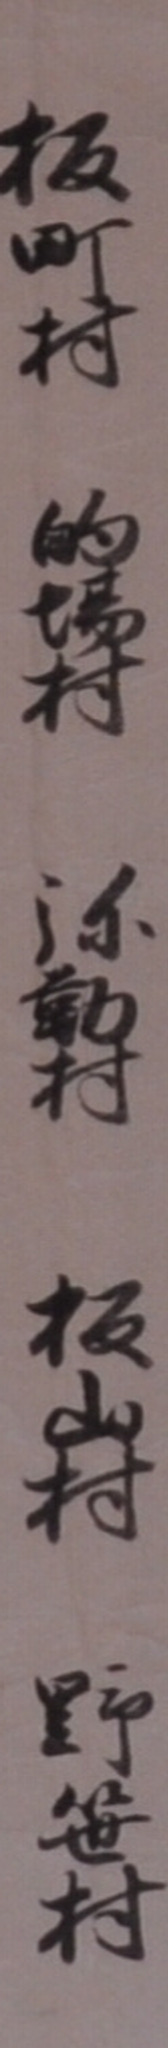板町村的場村弥勒村板山村野笹村
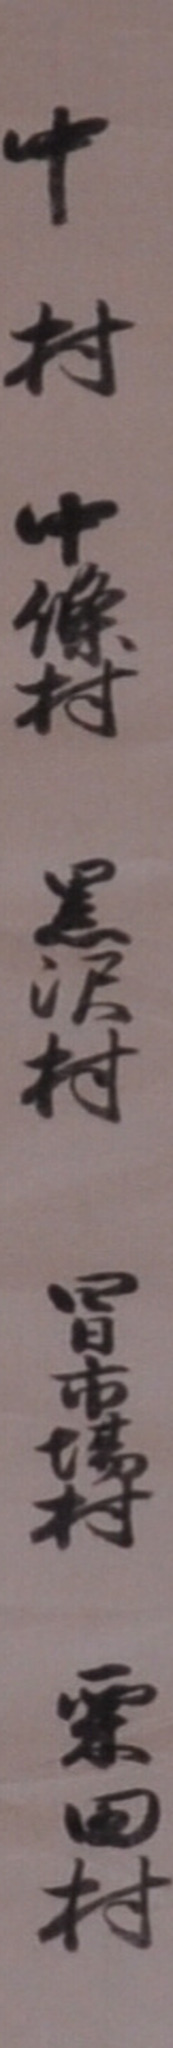中村中條村黒沢村四日市場村栗田村
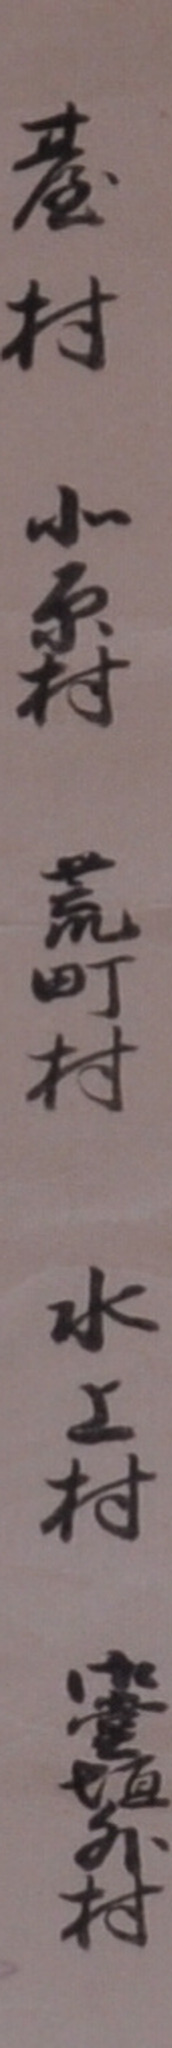台村北原村荒町村水上村御堂垣外村
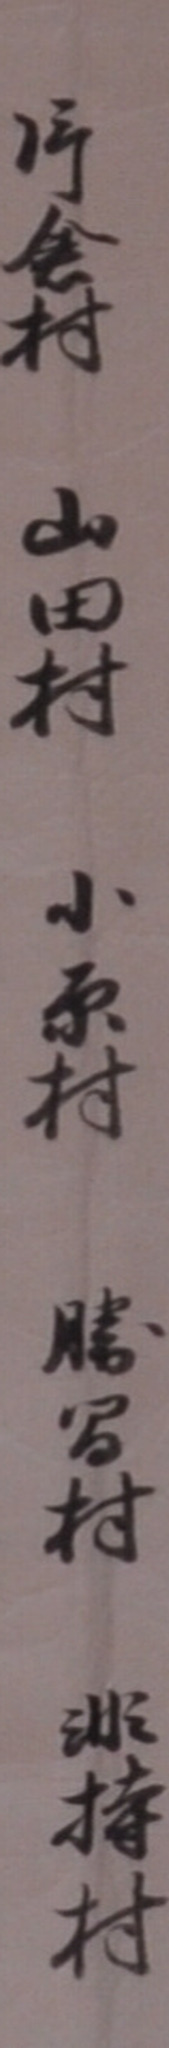片倉村山田村小原村勝間村非持村
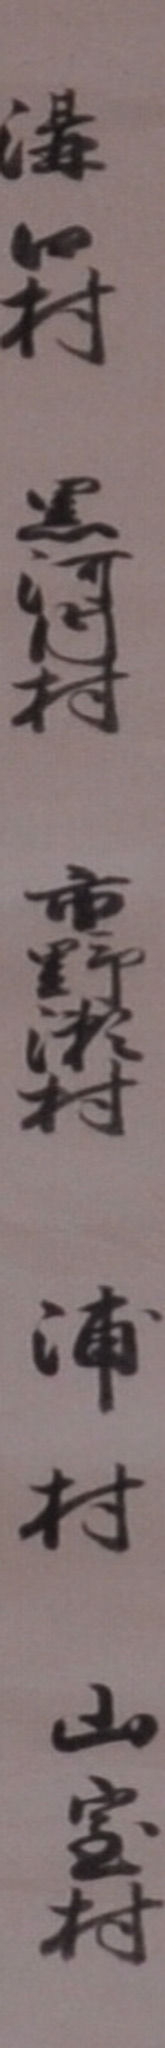溝口村黒河内村市野瀬村浦村山室村
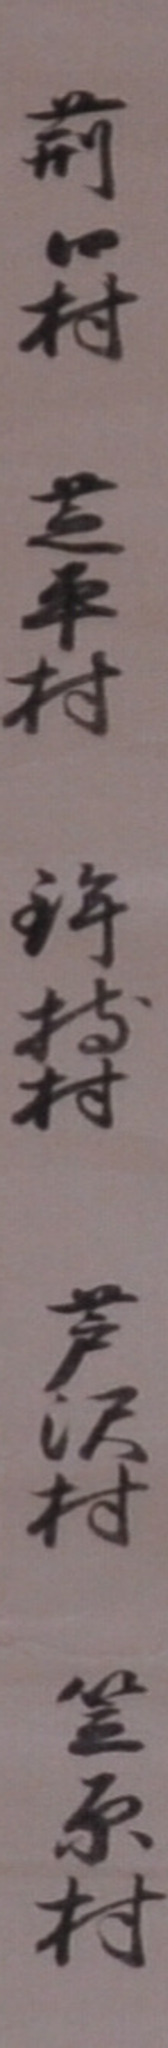荊口村芝平村鉾持村芦沢村笠原村
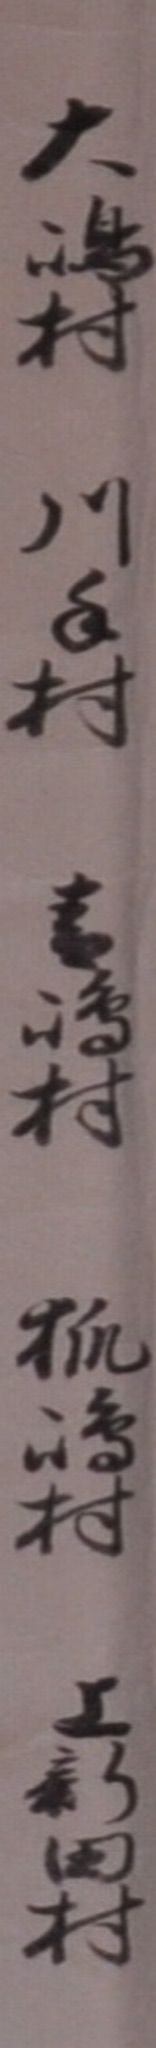大嶋村川手村青嶋村狐嶋村上新田村
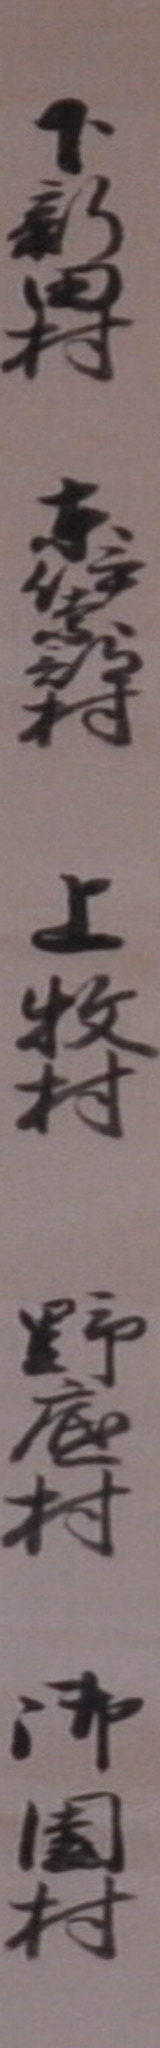下新田村東伊奈部村上牧村野底村御園村
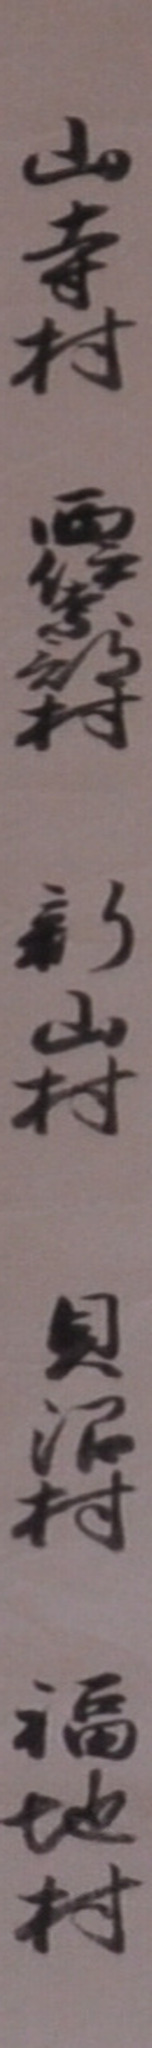山寺村西伊奈部村新山村貝沼村福地村
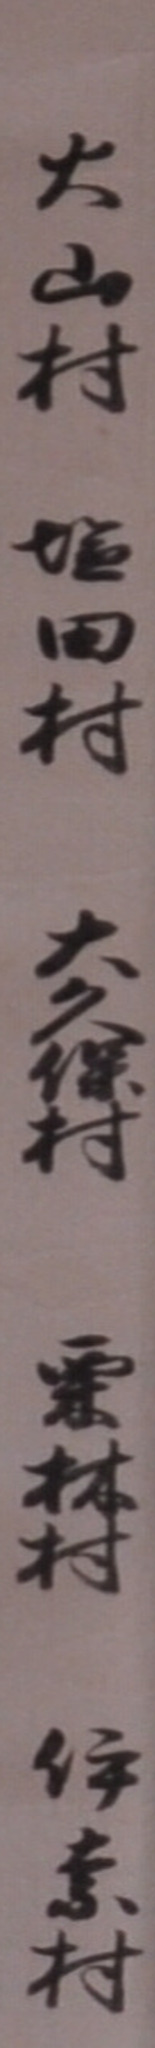火山村塩田村大久保村栗林村伊奈村
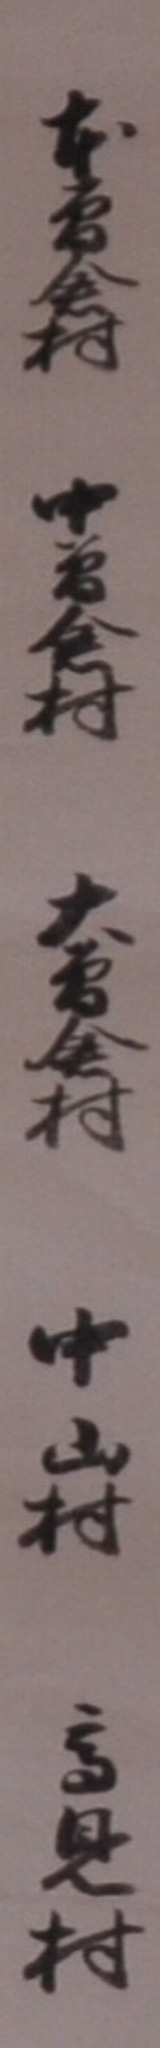本曽倉村中曽倉村大曽倉村中山村高見村

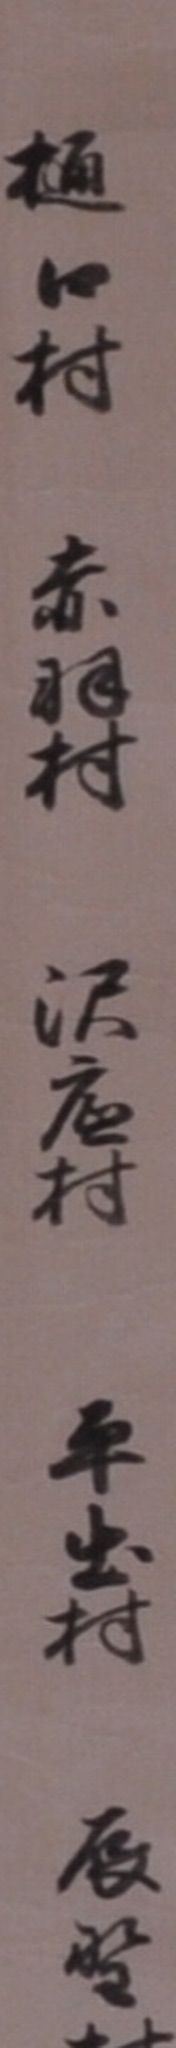樋口村赤羽村沢底村平出村辰野村
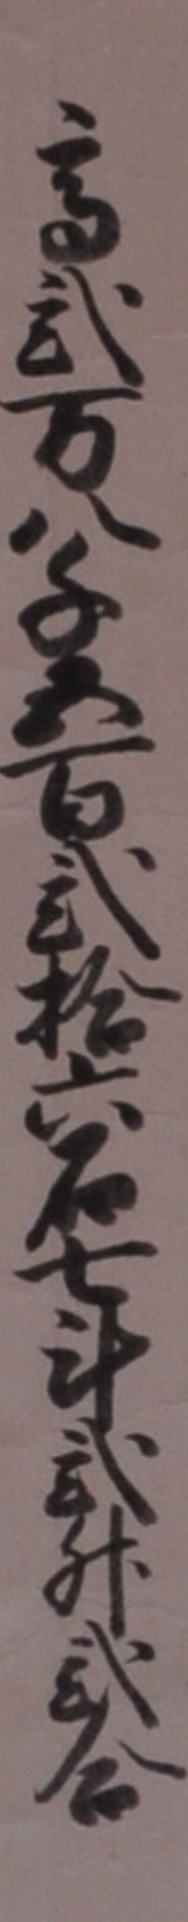高弐万八千五百弐拾六石七斗弐升弐合
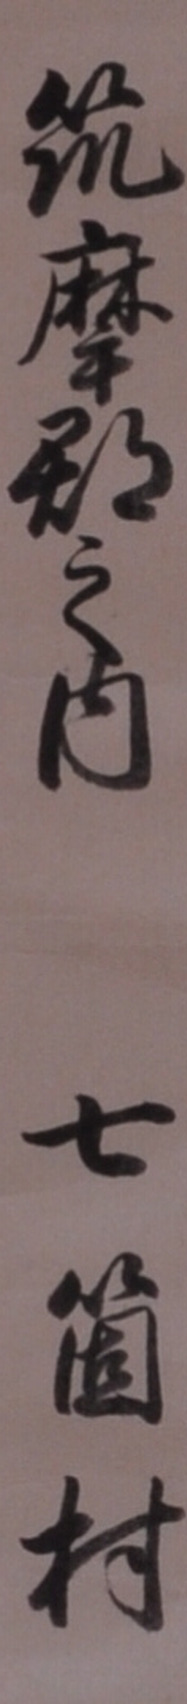筑摩郡之内七箇村
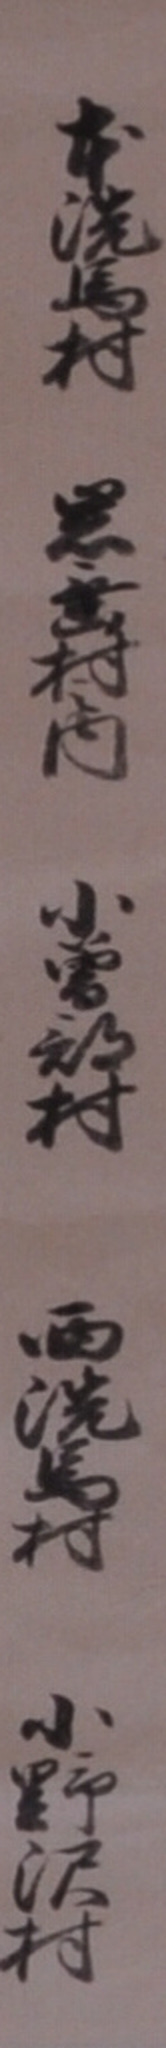本洗馬村岩垂村之内小曽部村西洗馬村小野沢村
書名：御朱印写・領地目録写
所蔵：伊那市立高遠町図書館・合同会社AMANE
